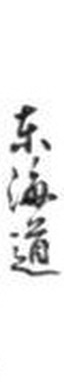東海道
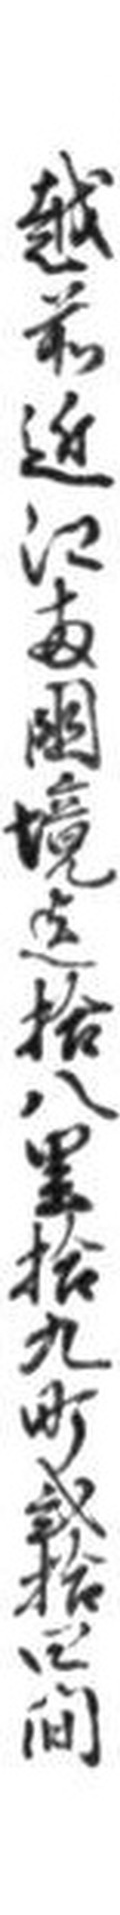越前近江両国境迄拾八里拾九町弐拾四間
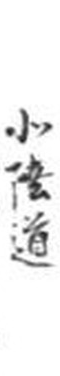北陸道
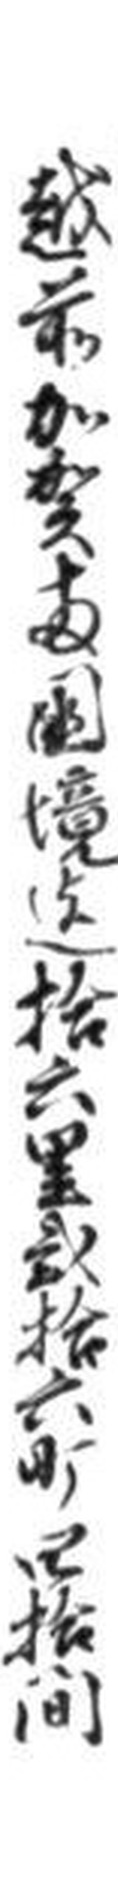越前加賀両国境迄拾六里弐拾六町四拾間
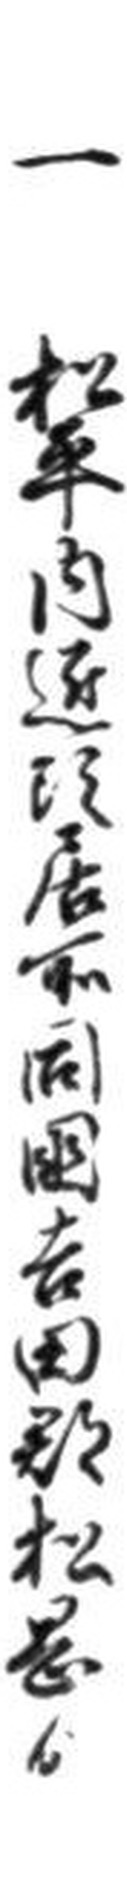一松平内匠頭居所同国吉田郡松岡ゟ
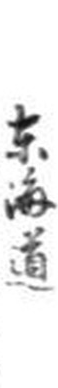東海道
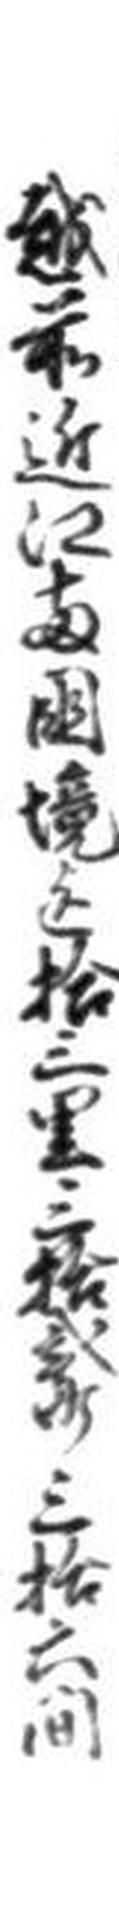越前近江両国境迄拾三里三拾弐町三拾六間
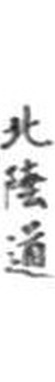北陸道
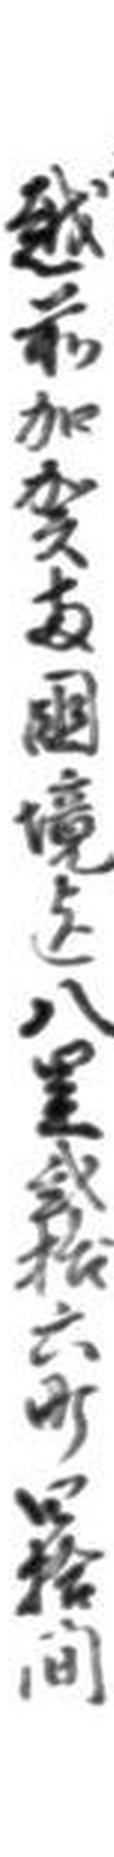越前加賀両国境迄八里弐拾六町四拾間
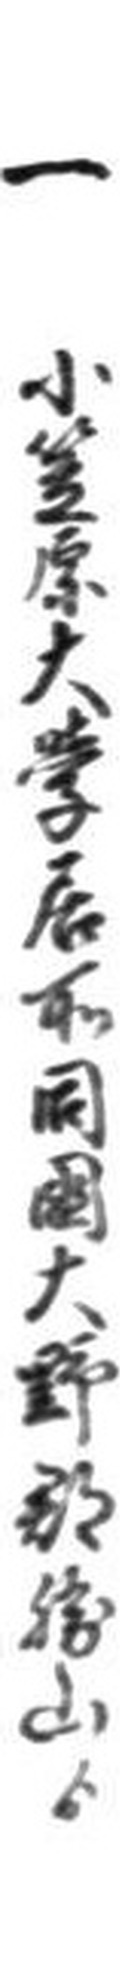一小笠原大学居所同国大野郡勝山ゟ
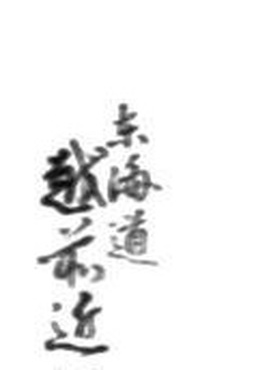東海道
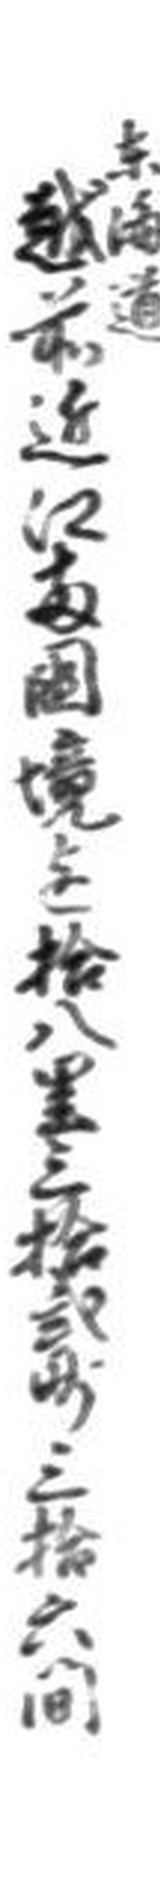越前近江両国境迄拾八里三拾弐町三拾六間
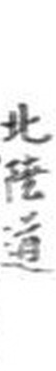北陸道
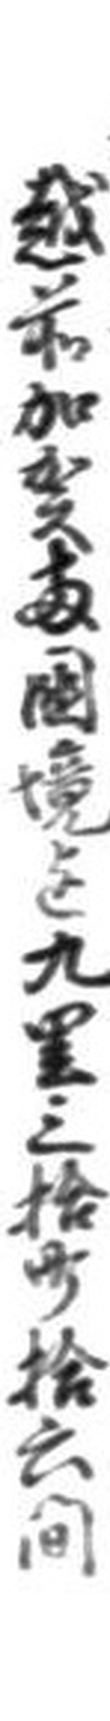越前加賀両国境迄九里三拾町拾六間
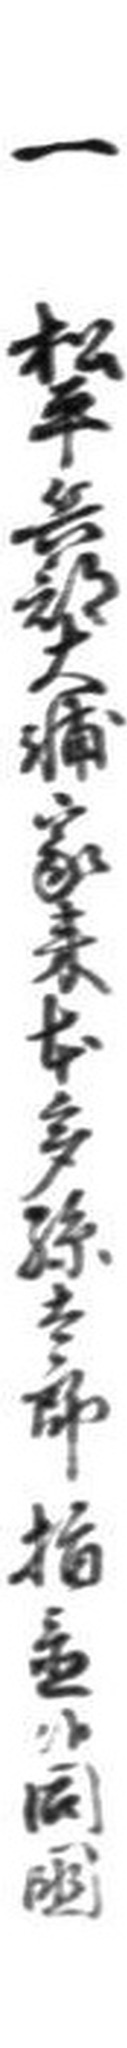一松平兵部大輔家来本多孫太郎指置候同国

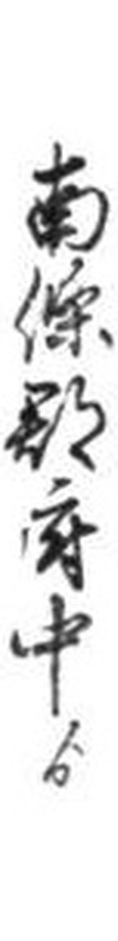南条郡府中ゟ
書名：家譜 二十二 吉品公 従元禄十五年到同十六年
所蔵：福井県文書館 Fukui Prefectural Archives
